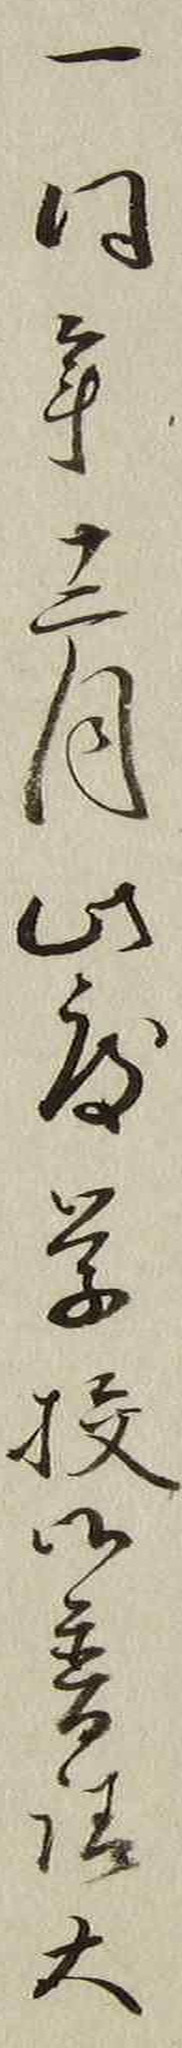一同年十二月此度学校御普請大
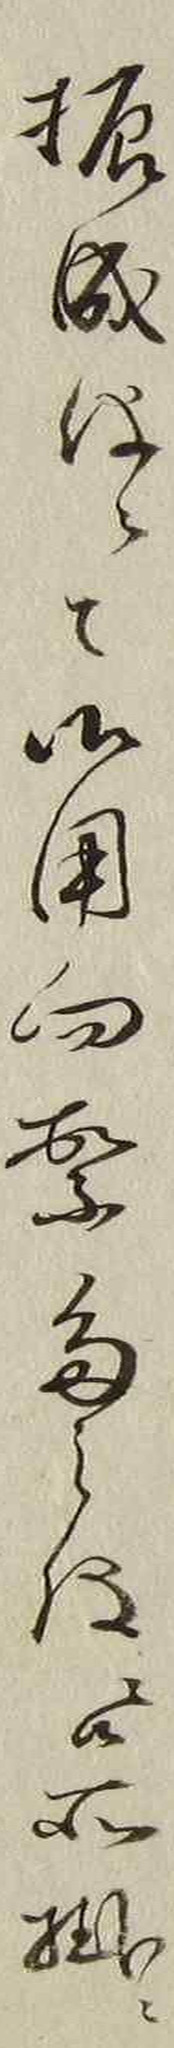振成儀には御用向繁多之儀に候所掛に
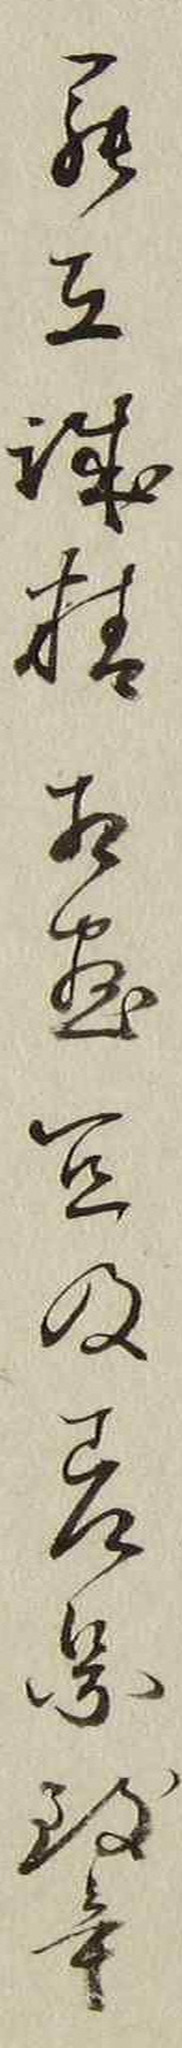罷在誠精相盡宜及差図致辛
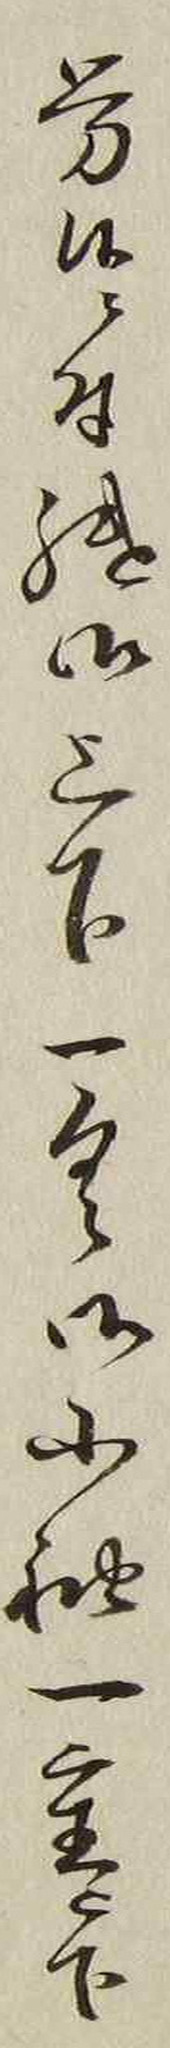労候に付御上下一具御小袖一重被下
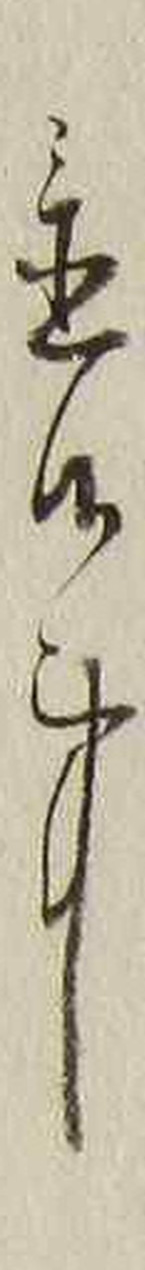置候事
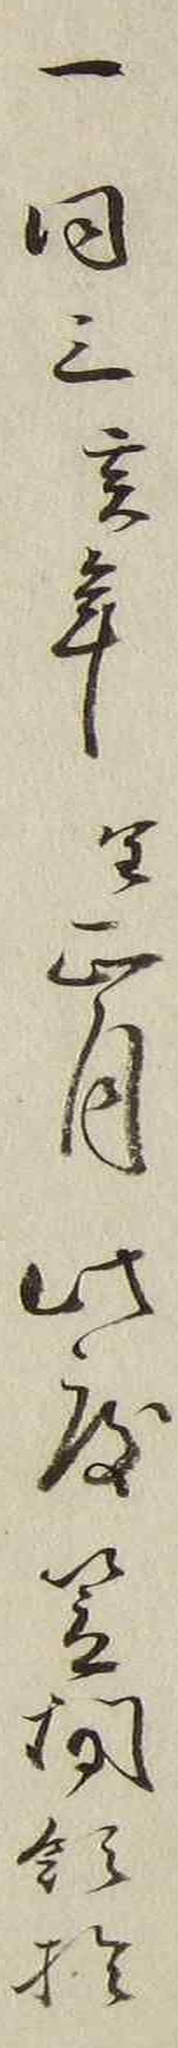一同三亥年閏正月此度笠間領於

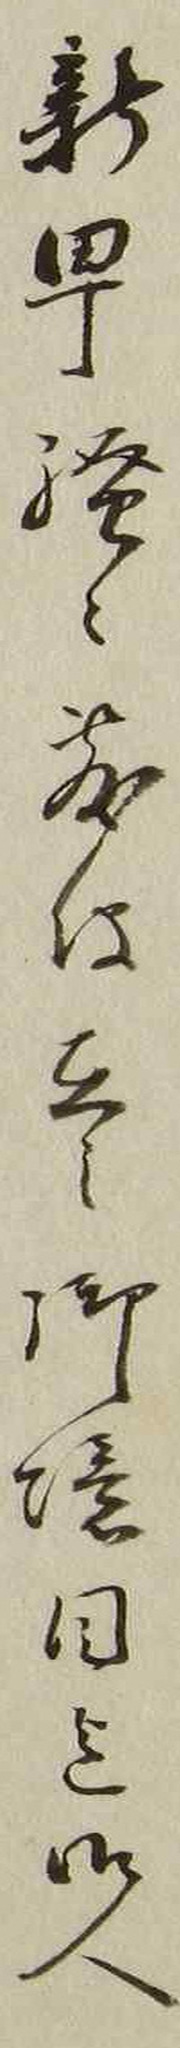新町騒々敷儀在之境境目迄御人
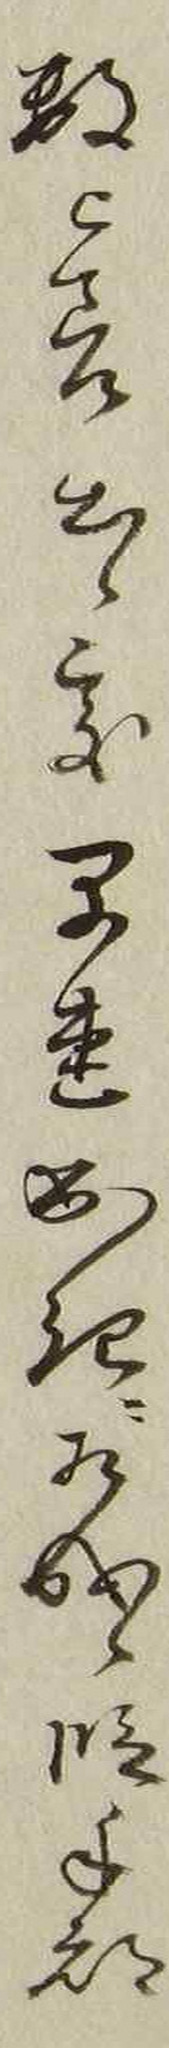数被差出候処早速出起に相成候段手部
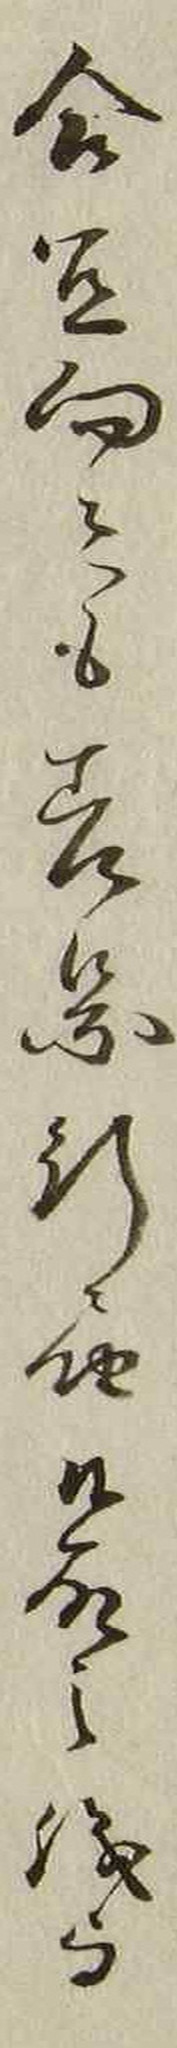合宜向々へも差図行届候故之儀と
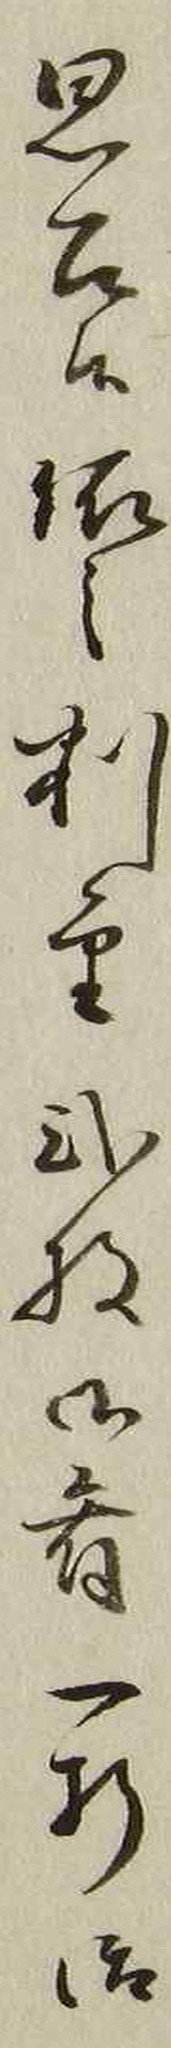思召候依之判金弐枚御肴一折御
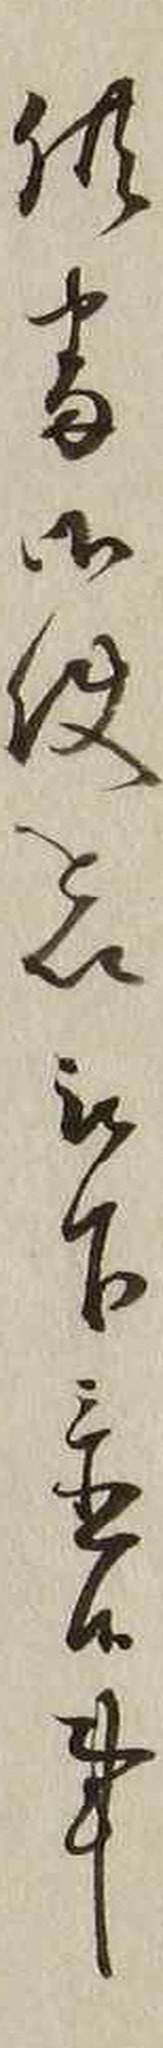供番御使を以被下置候事
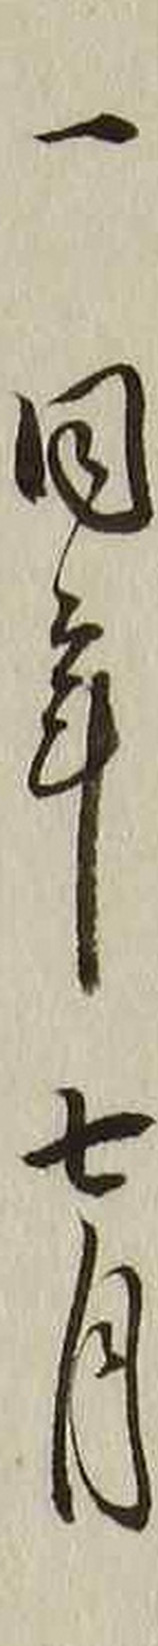一同年七月
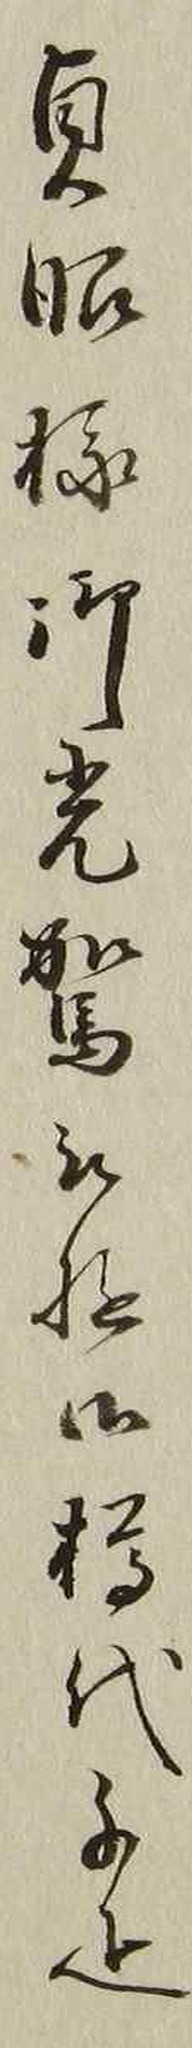貞昭様御光駕被遊御樽代千疋
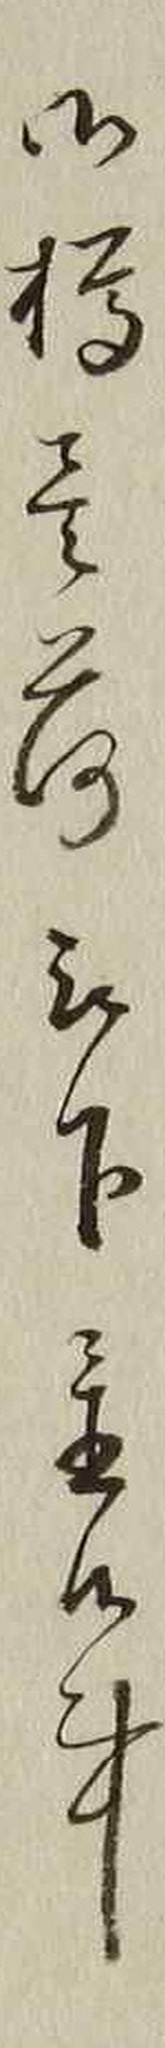御樽壱荷被下置候事
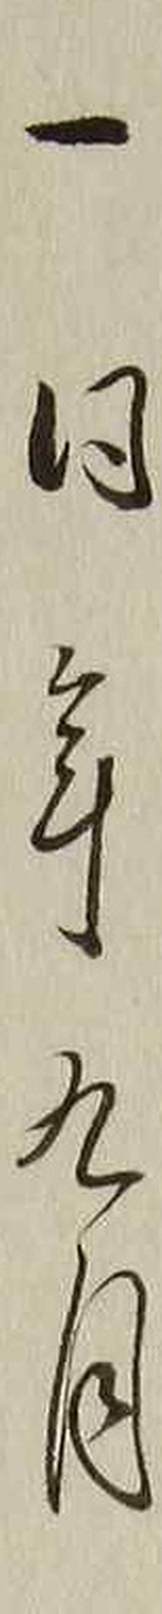一同年九月
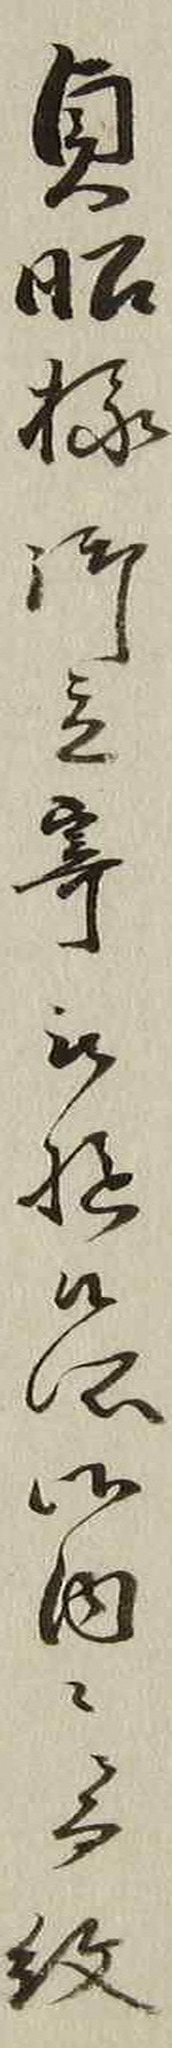貞昭様御立寄被遊候所御内々ニ而紋
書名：諸士系譜　巻之159　な之部1
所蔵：会津若松市立会津図書館
